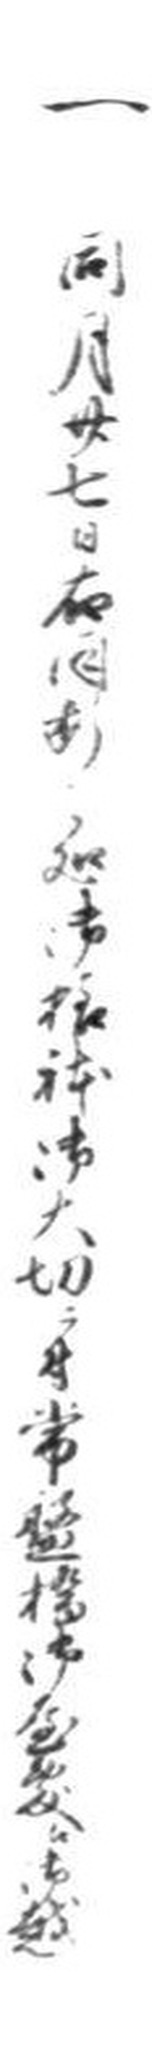一同月廿七日右同断之処御様躰御大切ニ付常盤橋御屋敷江御越
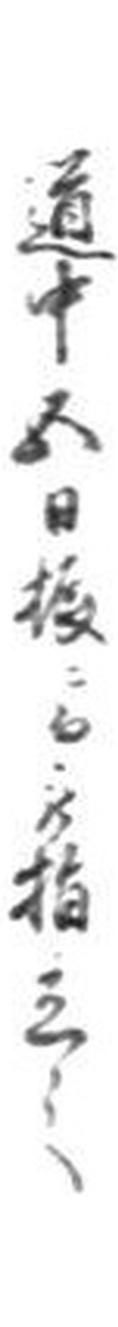道中五日振ニ而被指立之
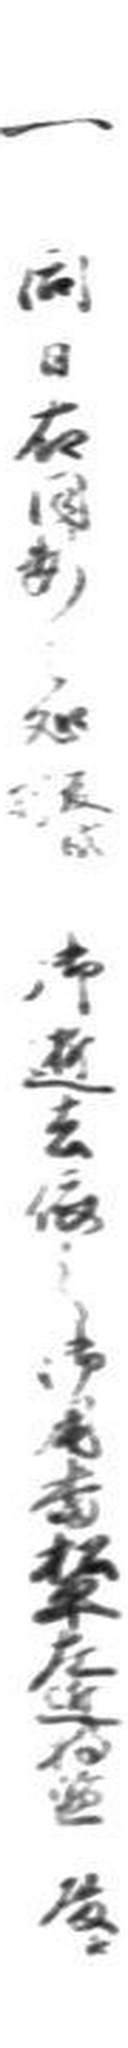一同日右同断之処戌刻御逝去依之御用番松平左近将監殿江
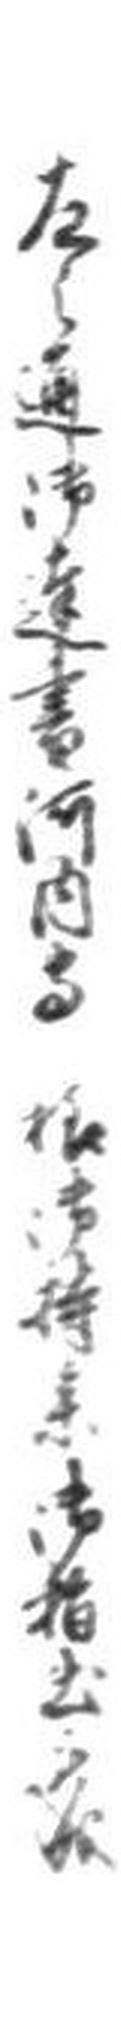左之通御達書河内守様御持参御指出被成
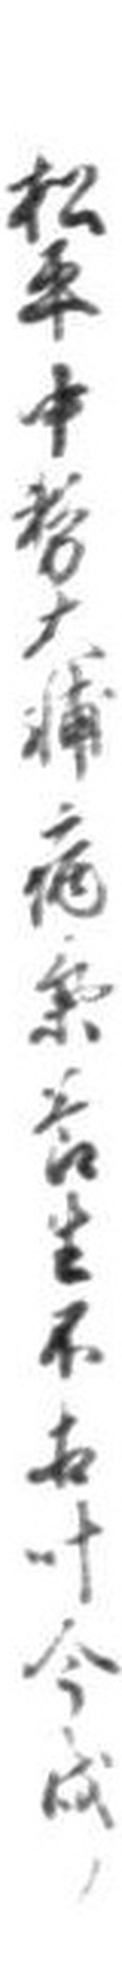松平中務大輔病気養生不相叶今戌ノ
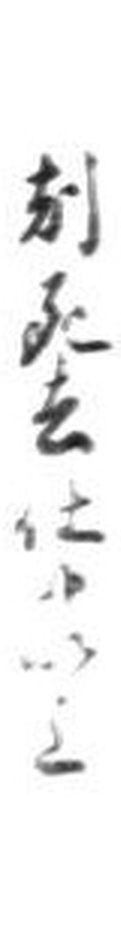刻死去仕候以上
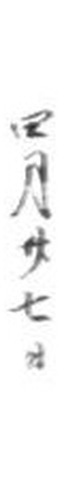四月廿七日
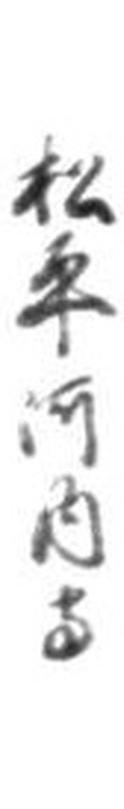松平河内守
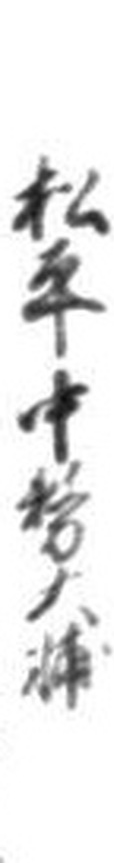松平中務大輔
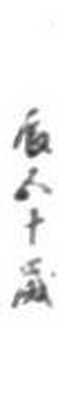辰五十歳

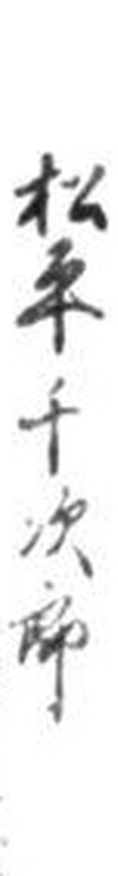松平千次郎
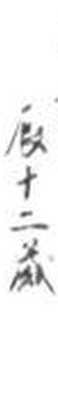辰十二歳
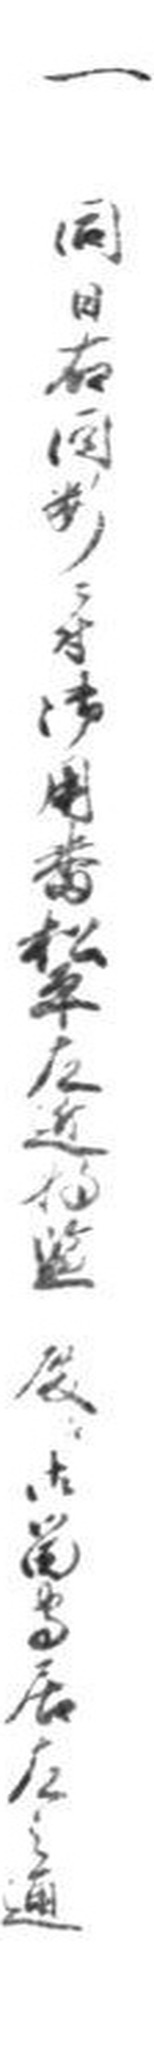一同日右同断ニ付御用番松平左近将監殿江御留守居左之通
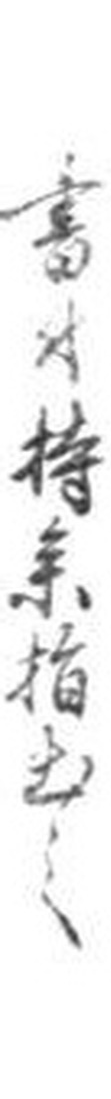書付持参指出之
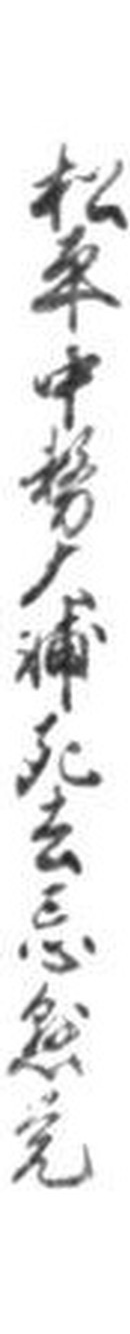松平中務大輔死去忌懸覚
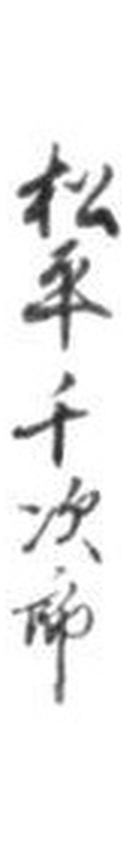松平千次郎
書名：家譜 三十七 宗矩公 従正徳五年到享保九年五月
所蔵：福井県文書館 Fukui Prefectural Archives
